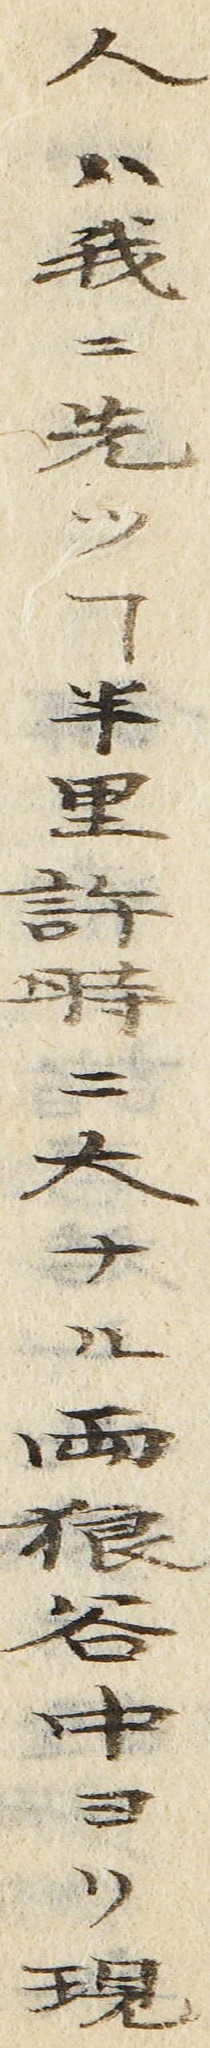人ハ我ニ先ツコト半里許時ニ大ナル両狼谷中ヨリ現
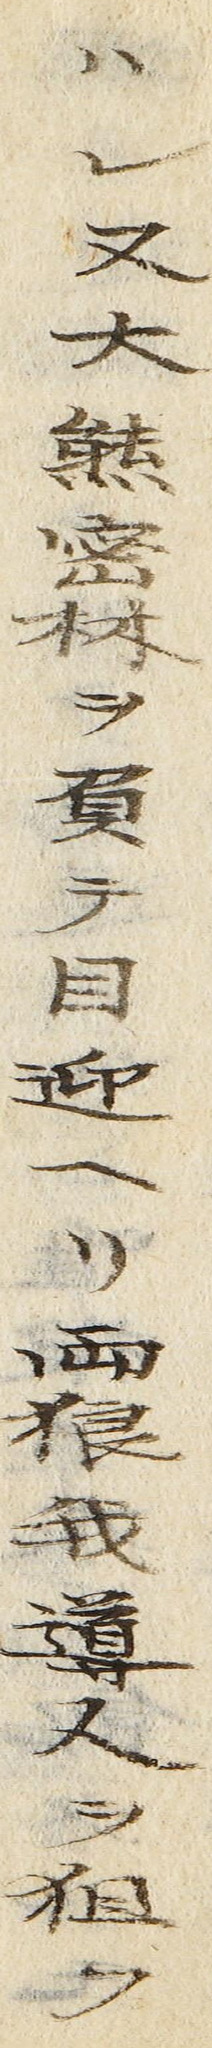ハレ又大熊密林ヲ負テ目迎ヘリ両狼我導人ヲ狙フ
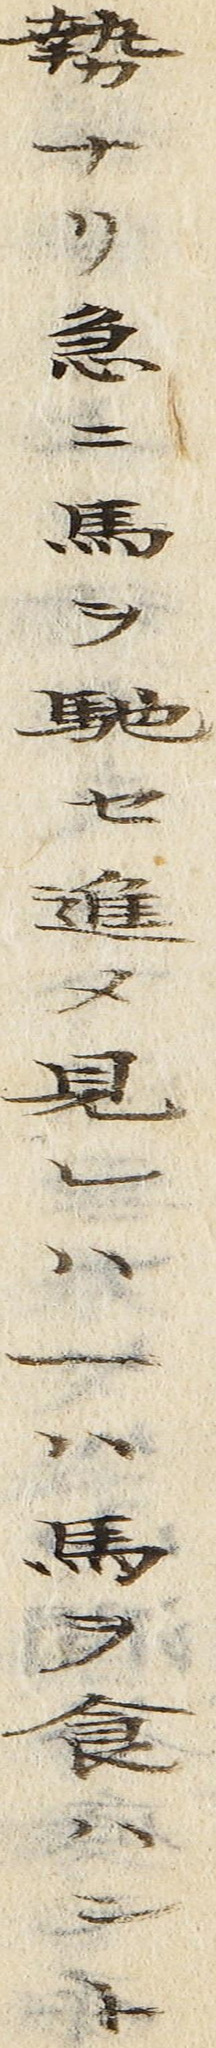勢ナリ急ニ馬ヲ馳セ進メ見レハ一ハ馬ヲ食ハント
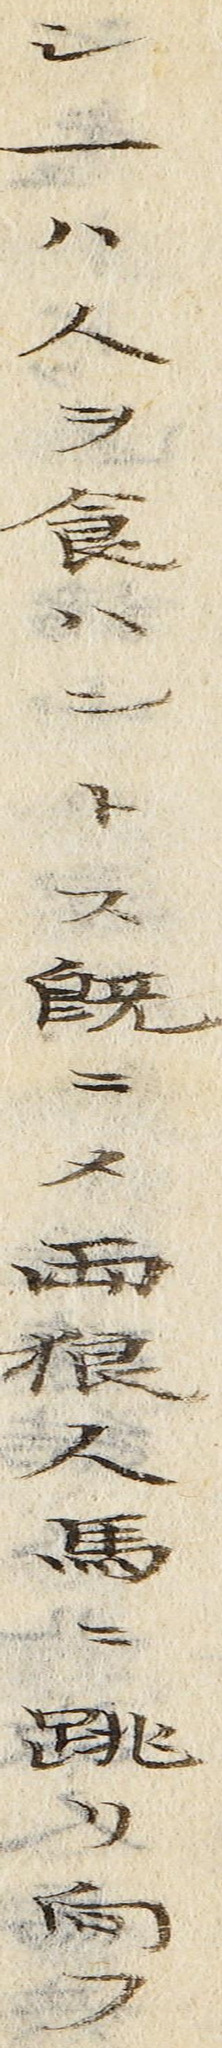シ一ハ人ヲ食ハントス既ニシテ両狼人馬ニ跳リ向フ
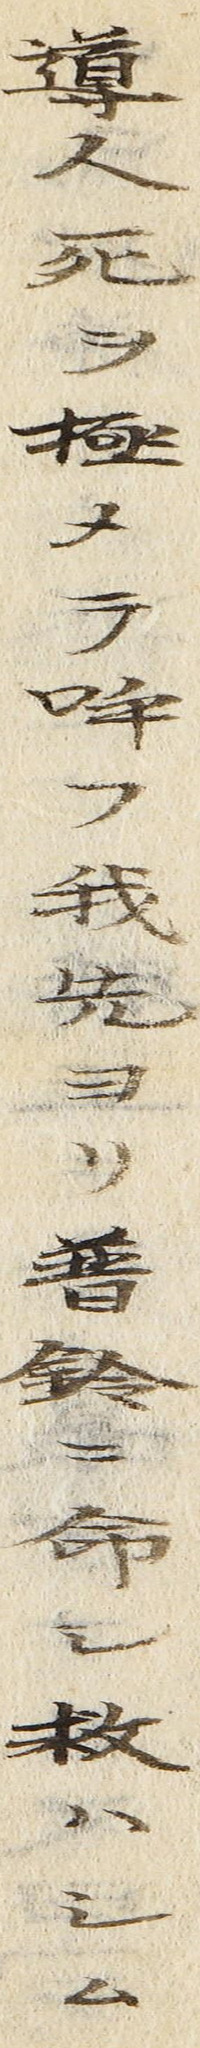導人死ヲ極メテ呼フ我先ヨリ普鈴ニ命シ救ハシム
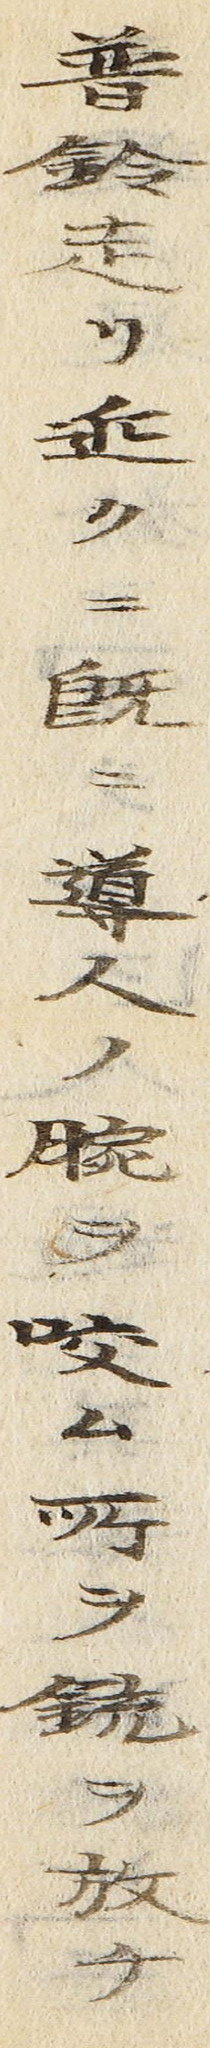普鈴走リ近クニ既ニ導人ノ腕ヲ咬ム所ヲ銃を放チ
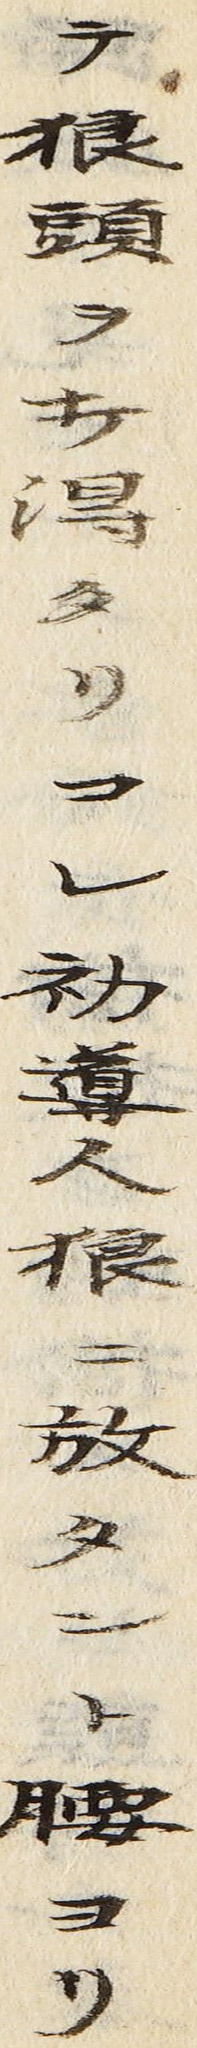テ狼頭ヲ打得タリコレ初導人狼ニ放タント腰ヨリ
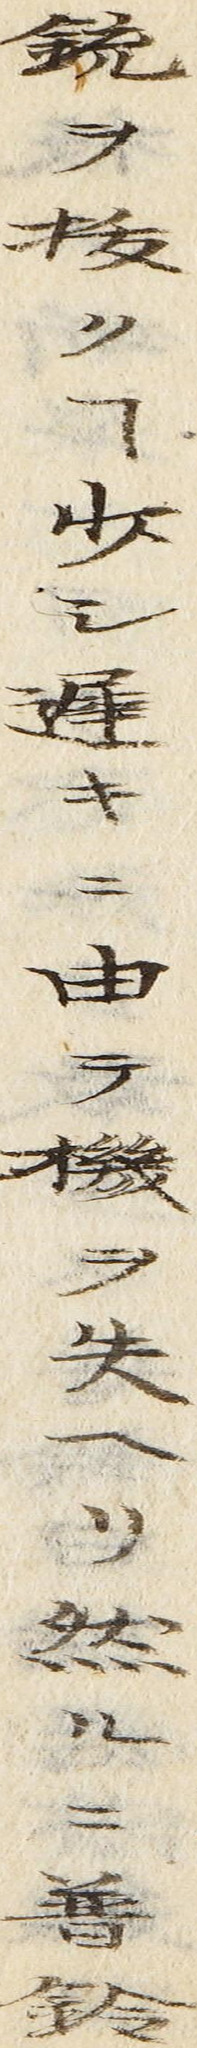銃ヲ抜クコト少シ遅キニ由テ機ヲ失ヘリ然ルニ普鈴
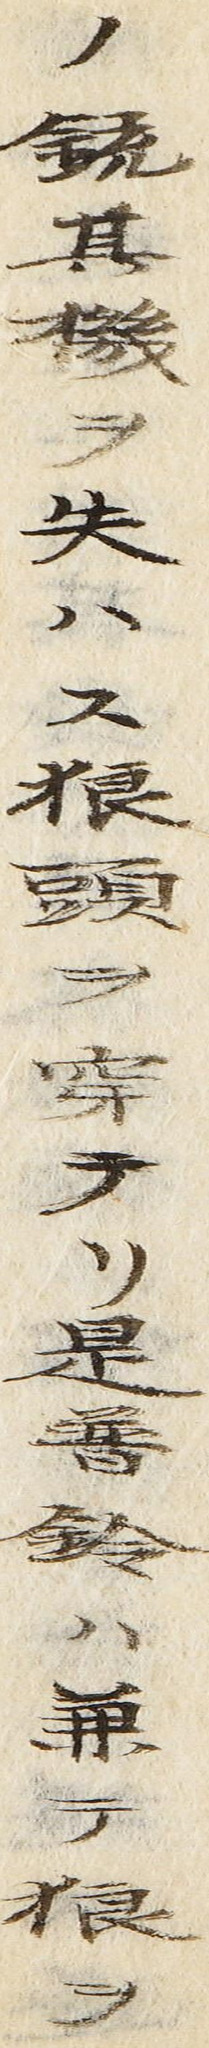ノ銃其機ヲ失ハス狼頭ヲ穿テリ是普鈴ハ兼テ狼ヲ
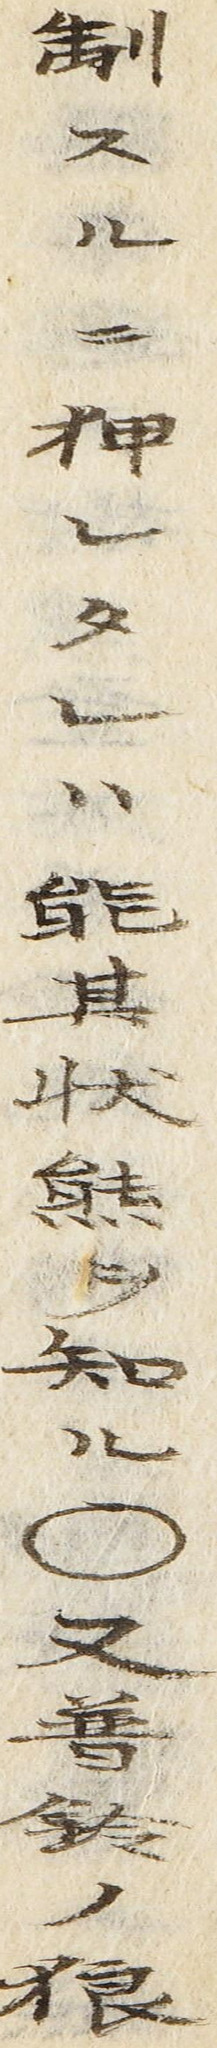制スルニ狎レタレハ能其状態ヲ知ル◯又普鈴ノ狼
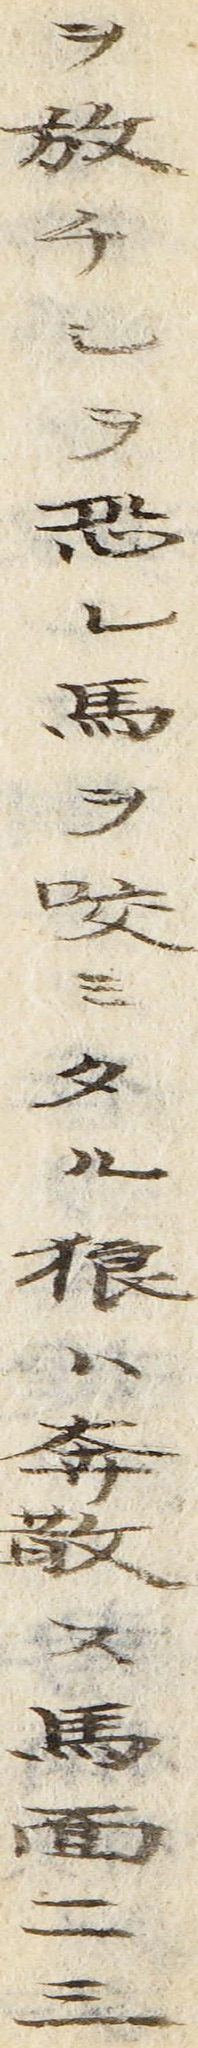ヲ放チシヲ恐レ馬ヲ咬ミタル狼ハ奔散ス馬面二三
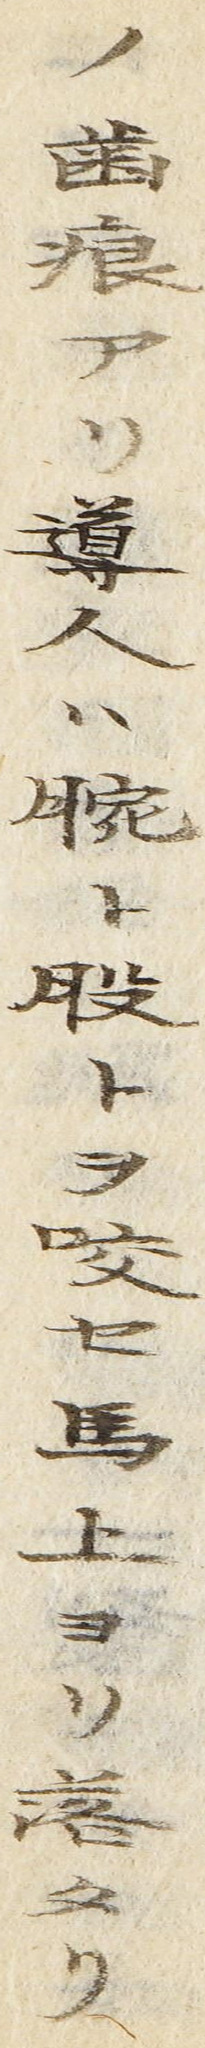ノ歯痕アリ導人ハ腕ト股トヲ咬セ馬上ヨリ落タリ
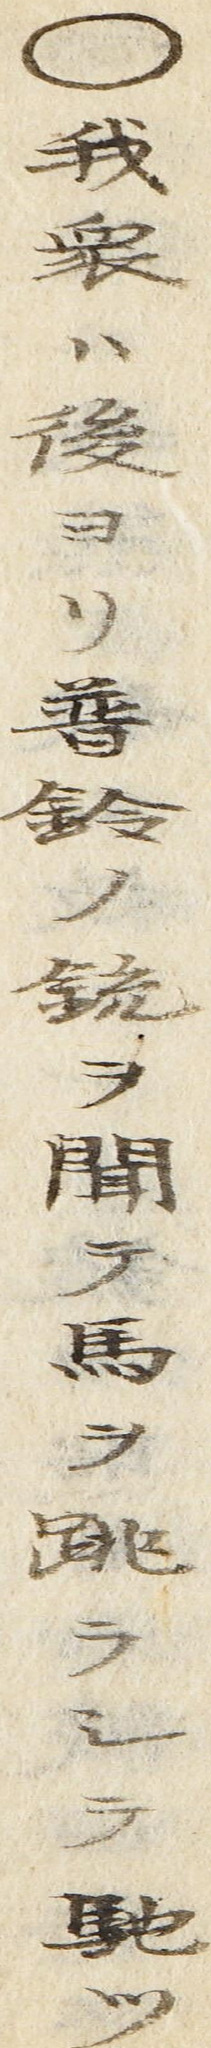◯我衆ハ後ヨリ普鈴ノ銃ヲ聞テ馬ヲ跳ラシテ馳ツ
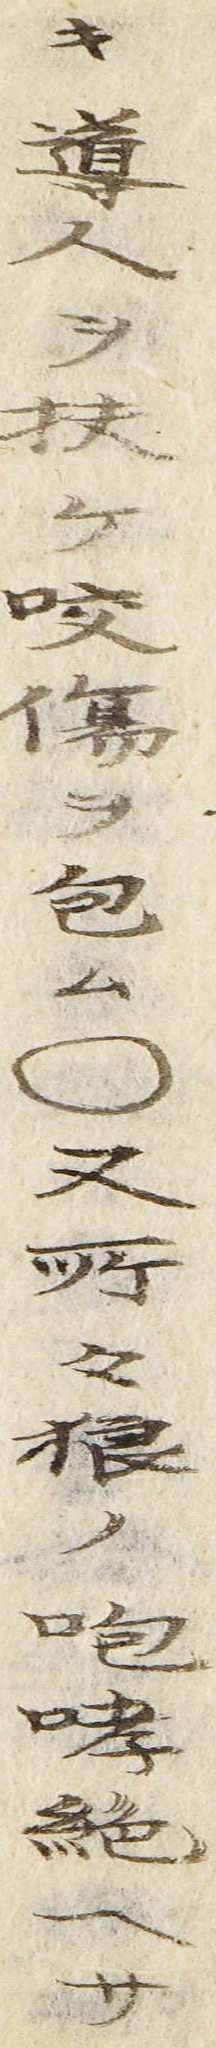キ導人ヲ扶ケ咬傷ヲ包ム◯又所々狼ノ咆哮絶ヘサ
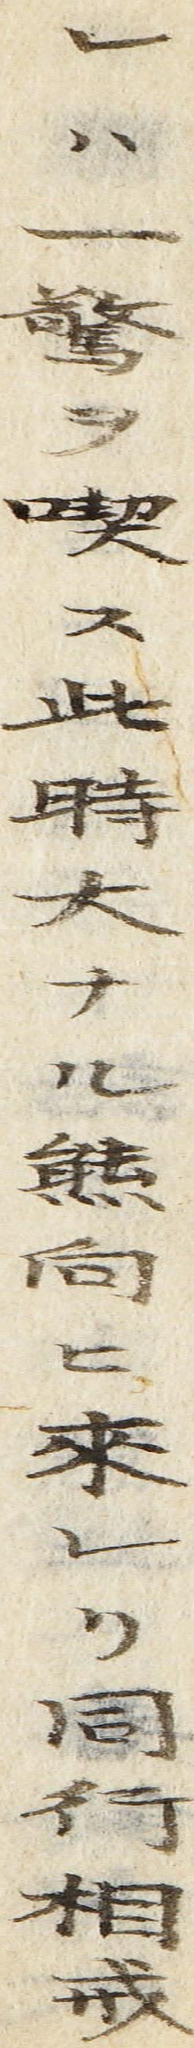レハ一驚ヲ喫ス此時大ナル熊向ヒ来レリ同行相戒
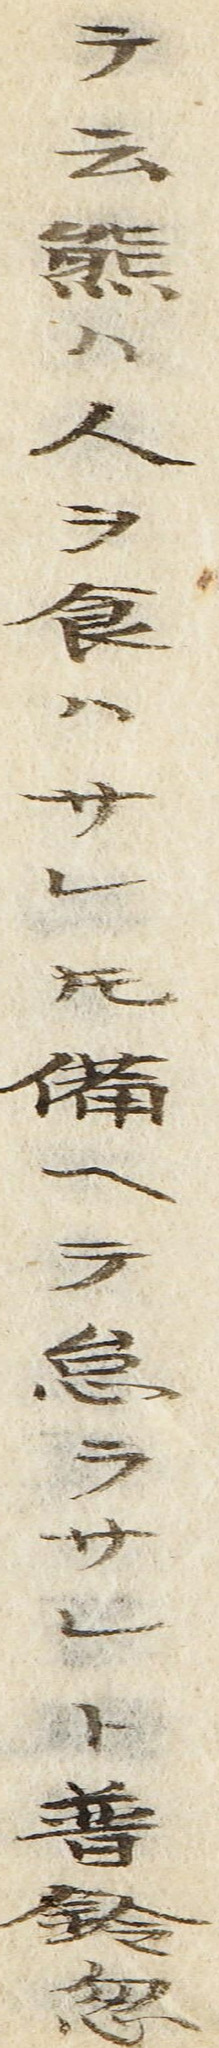テ云熊ハ人ヲ食ハサレトモ備ヘテ怠ラサレト普鈴忽
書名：漂流紀事
